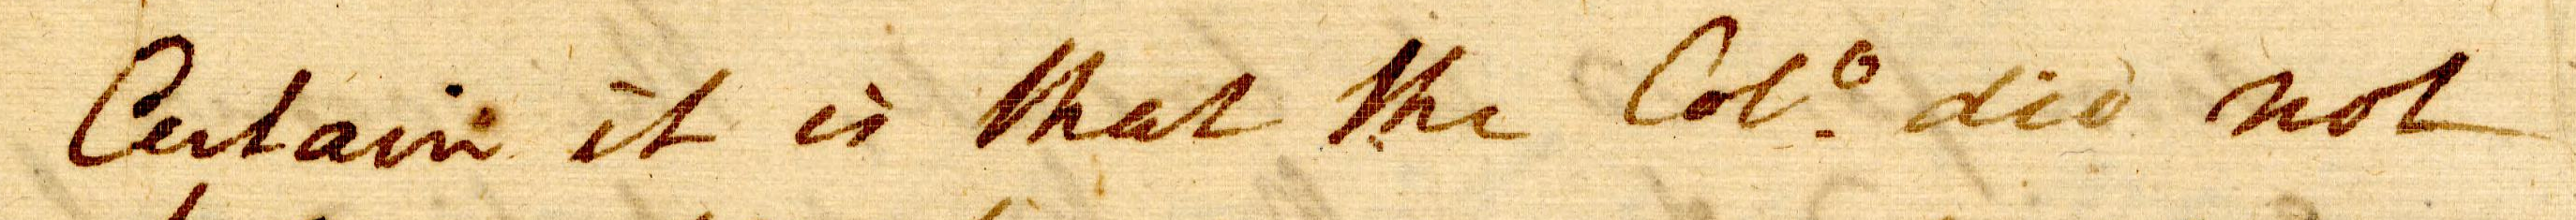Certain it is that the Col^o. did not
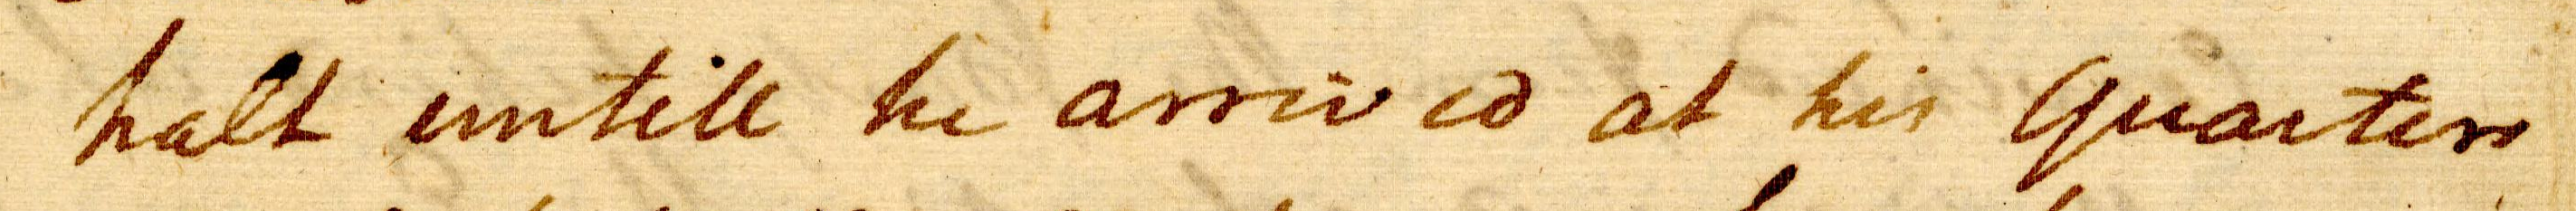halt untill he arrived at his quarters
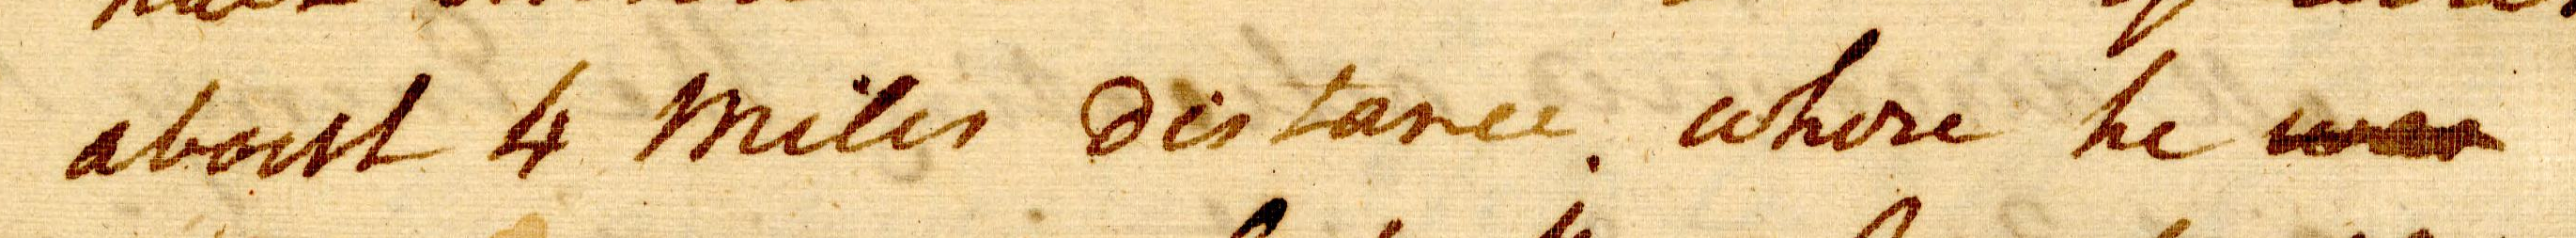about 4 Miles distance where he [was]
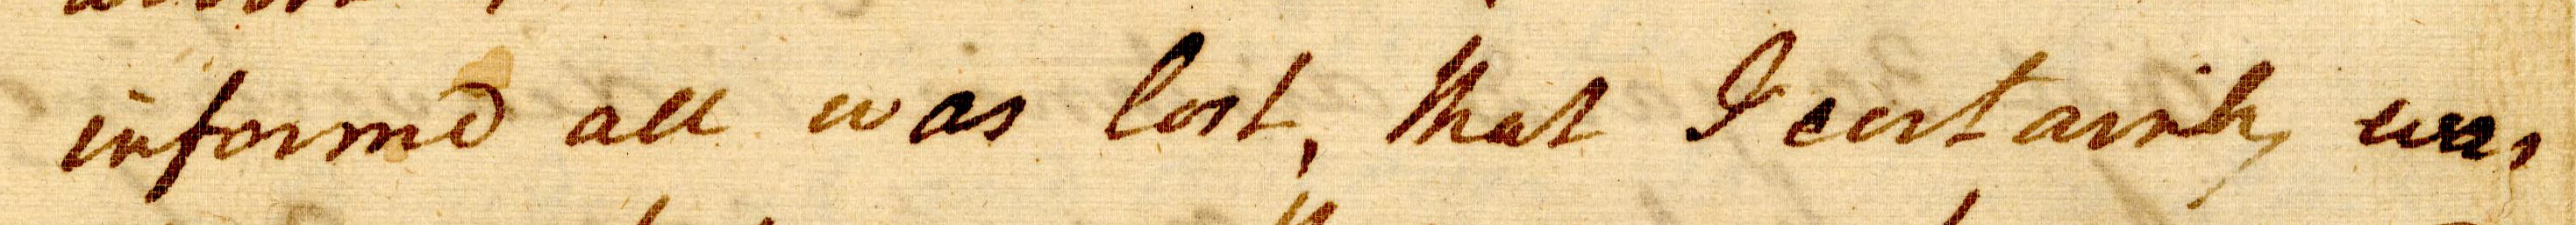informd all was lost, that I certainly was
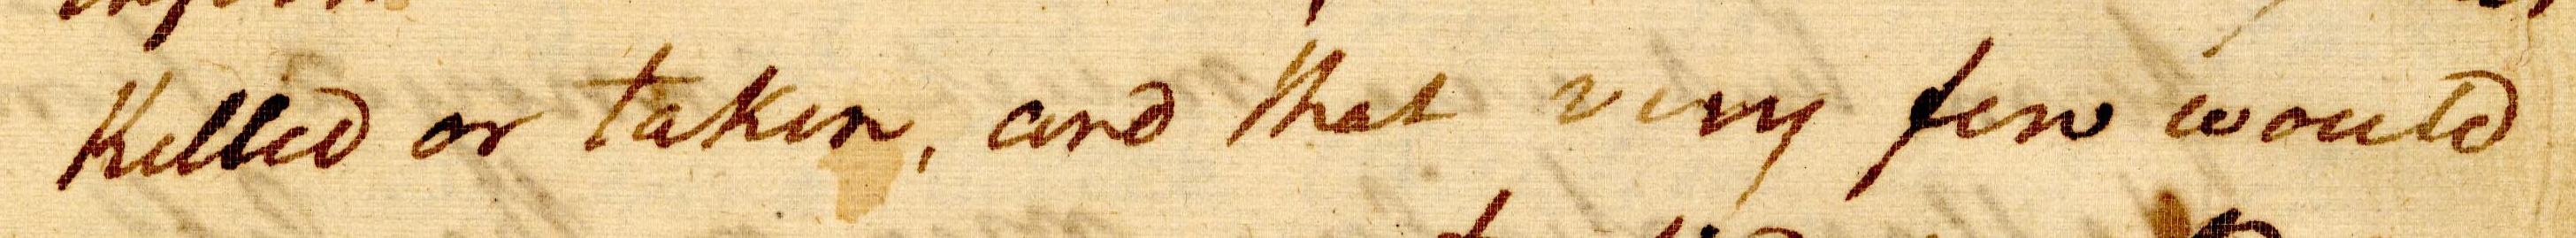Killed or taken, and that very few would
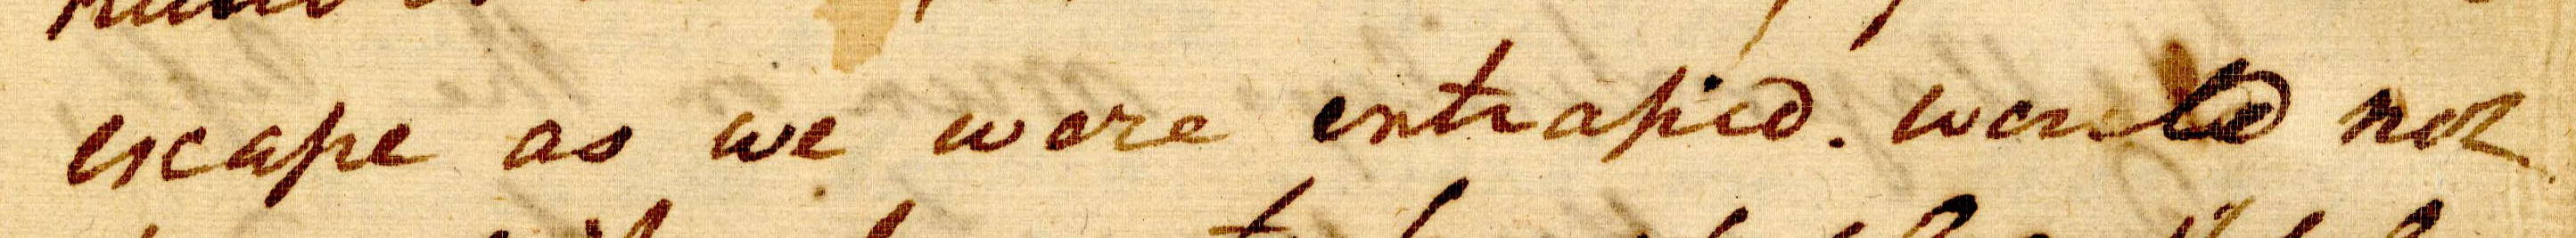escape as we were entraped. would not
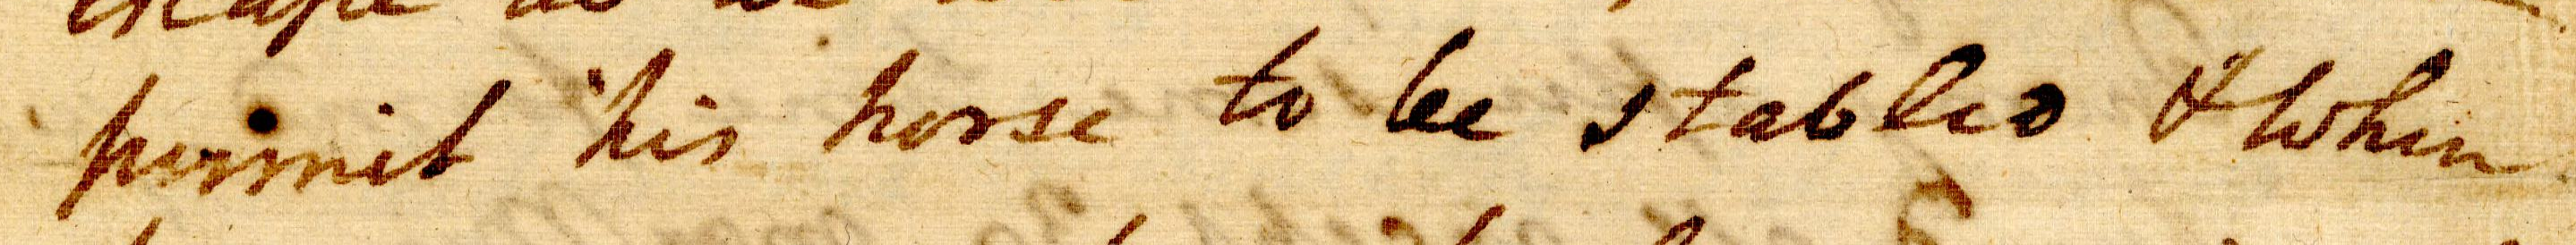permit his horse to be stabled & when
